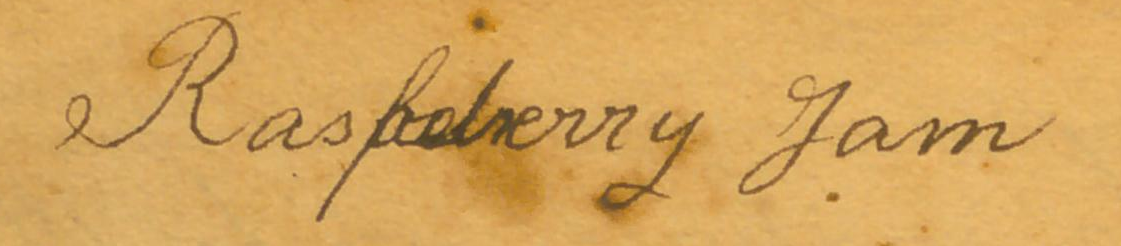Raspberry Jam
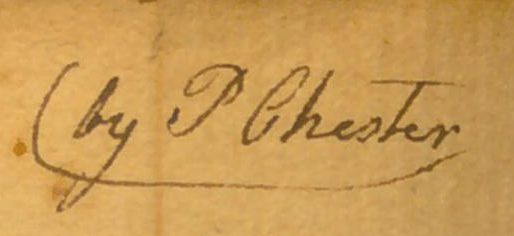by P Chester
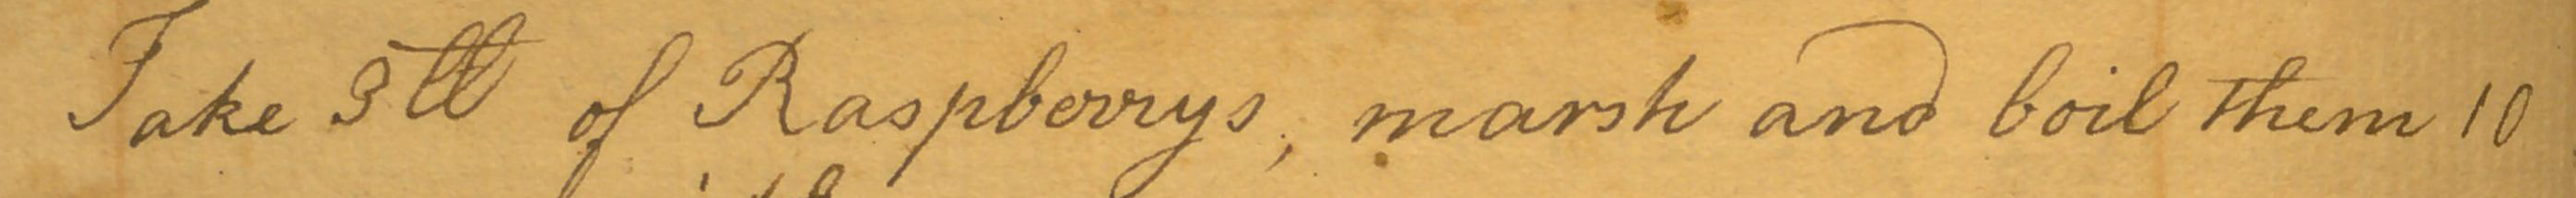Take 3 lb of Raspberrys, marsh and boil them 10
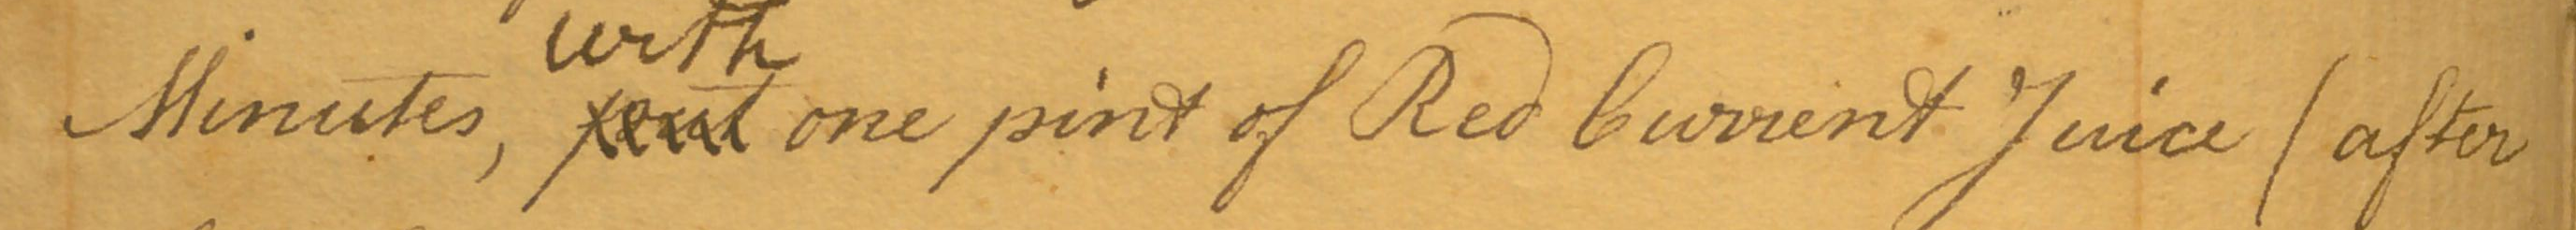Minutes, [___] one pint of Red Current Juice (after
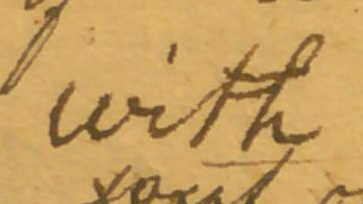with
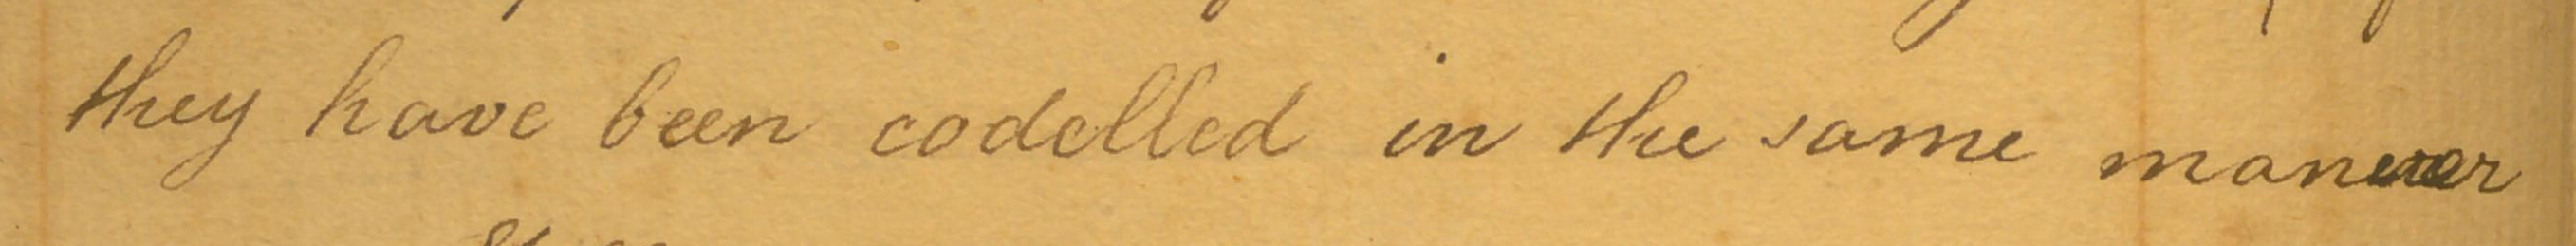they have been codelled in the same manner
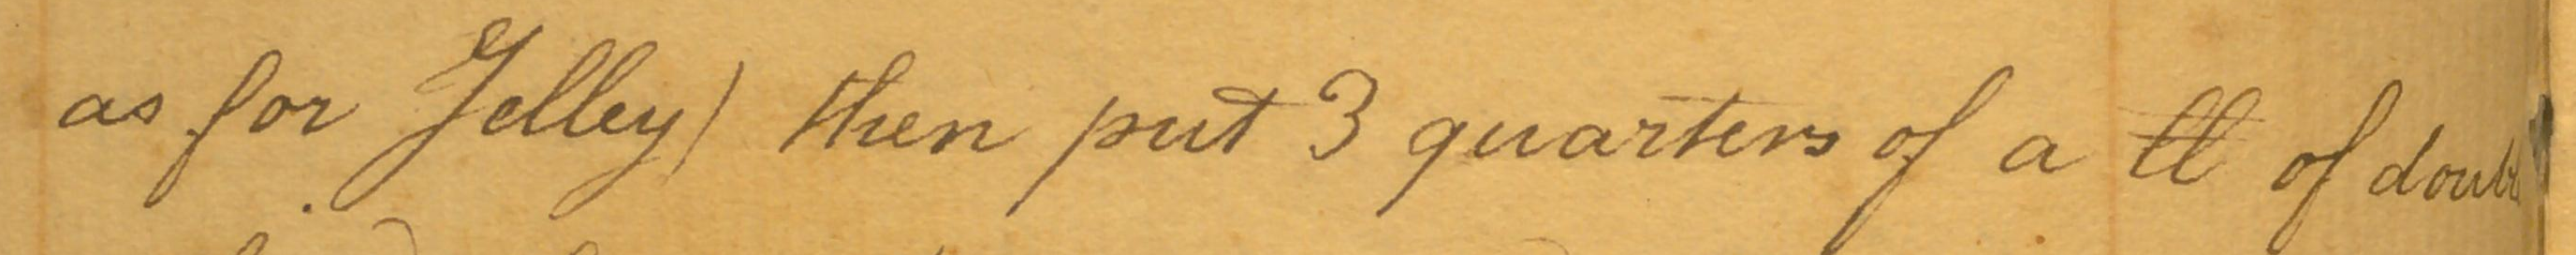as for Jelley) then put 3 quarters of a lb of double
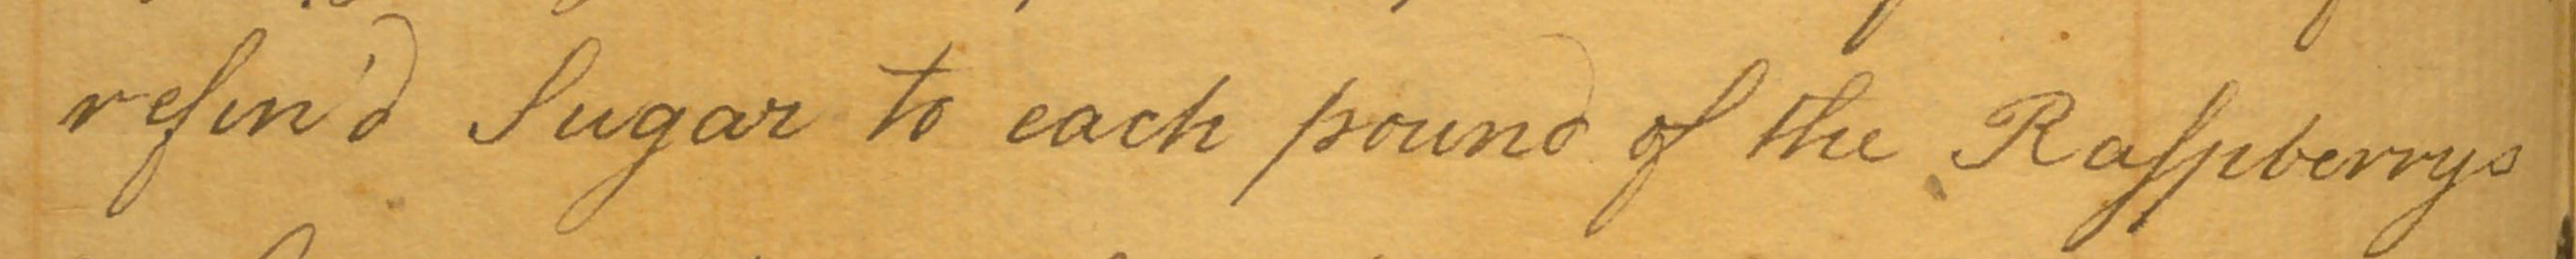refin'd sugar to each pound of the Raspberrys
